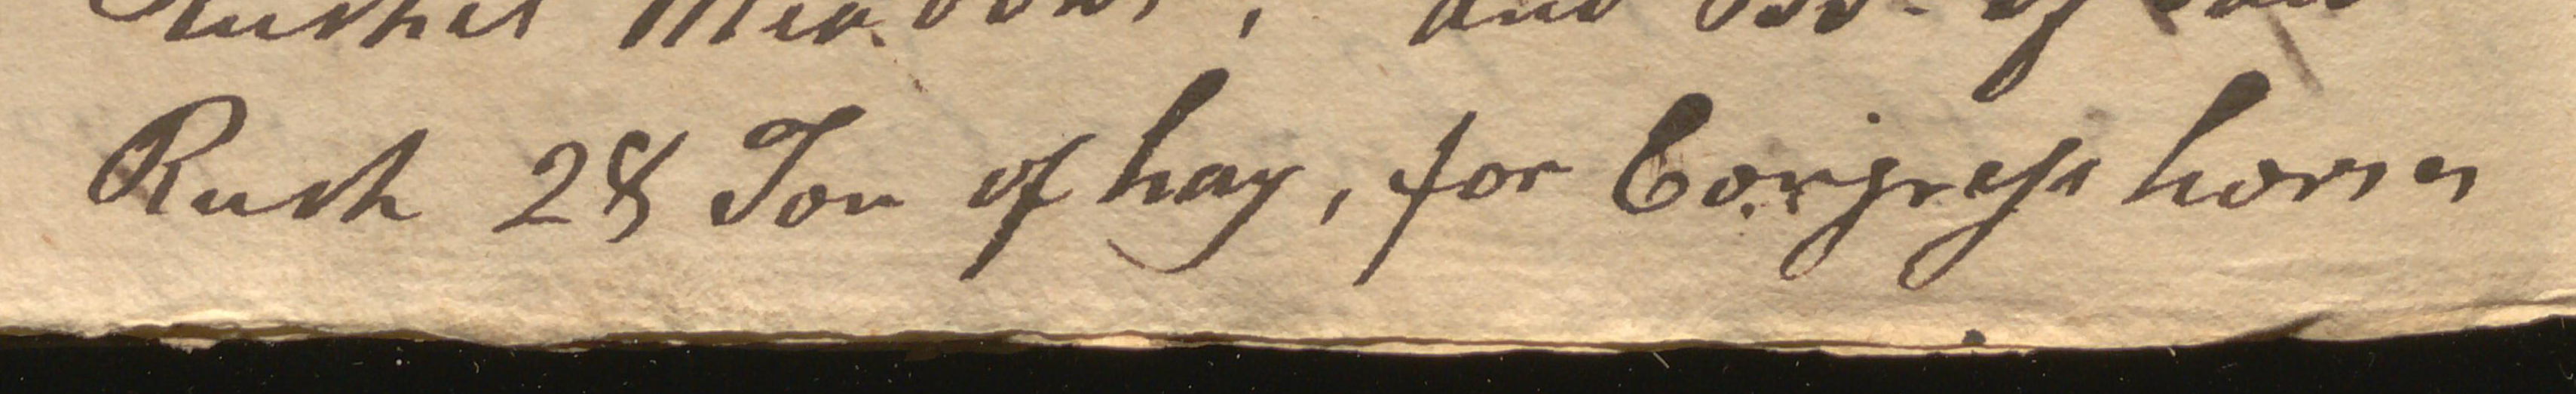Ruch 28 Ton of hays for Congress horses
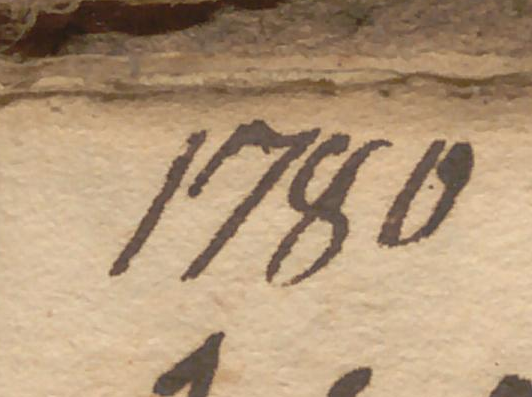1780
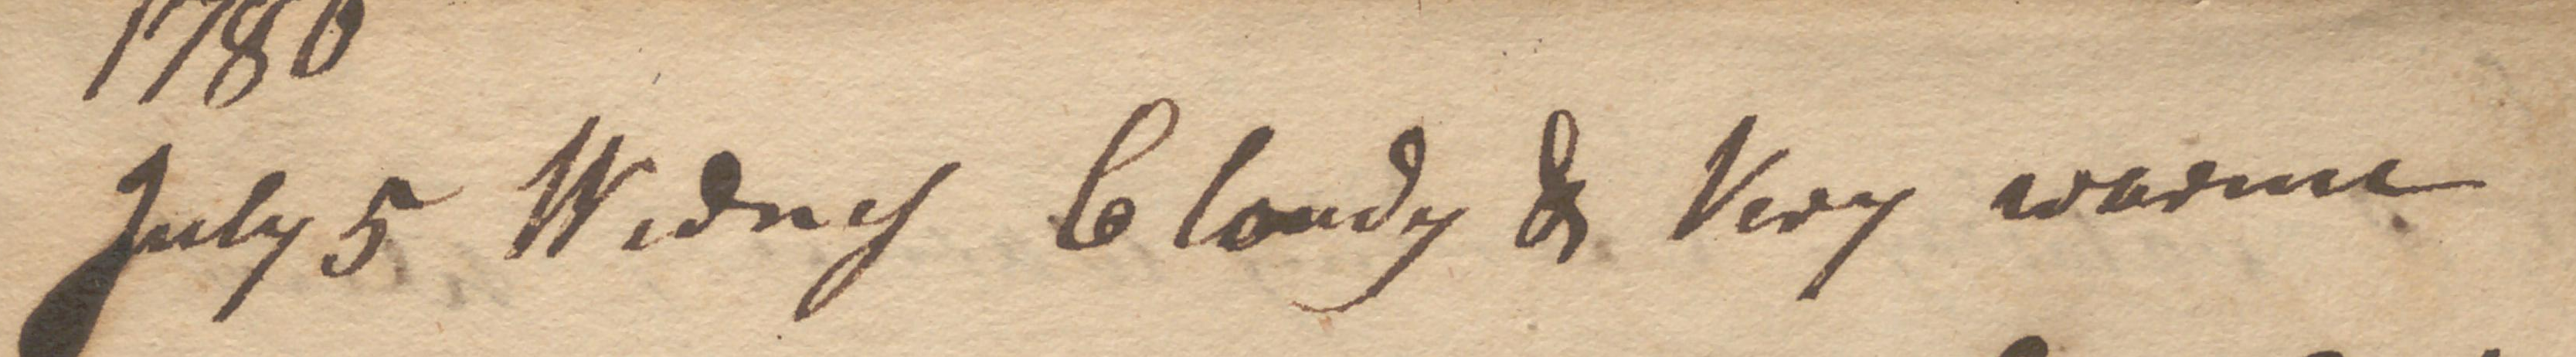July 5 Wednes Cloudy & Very warme
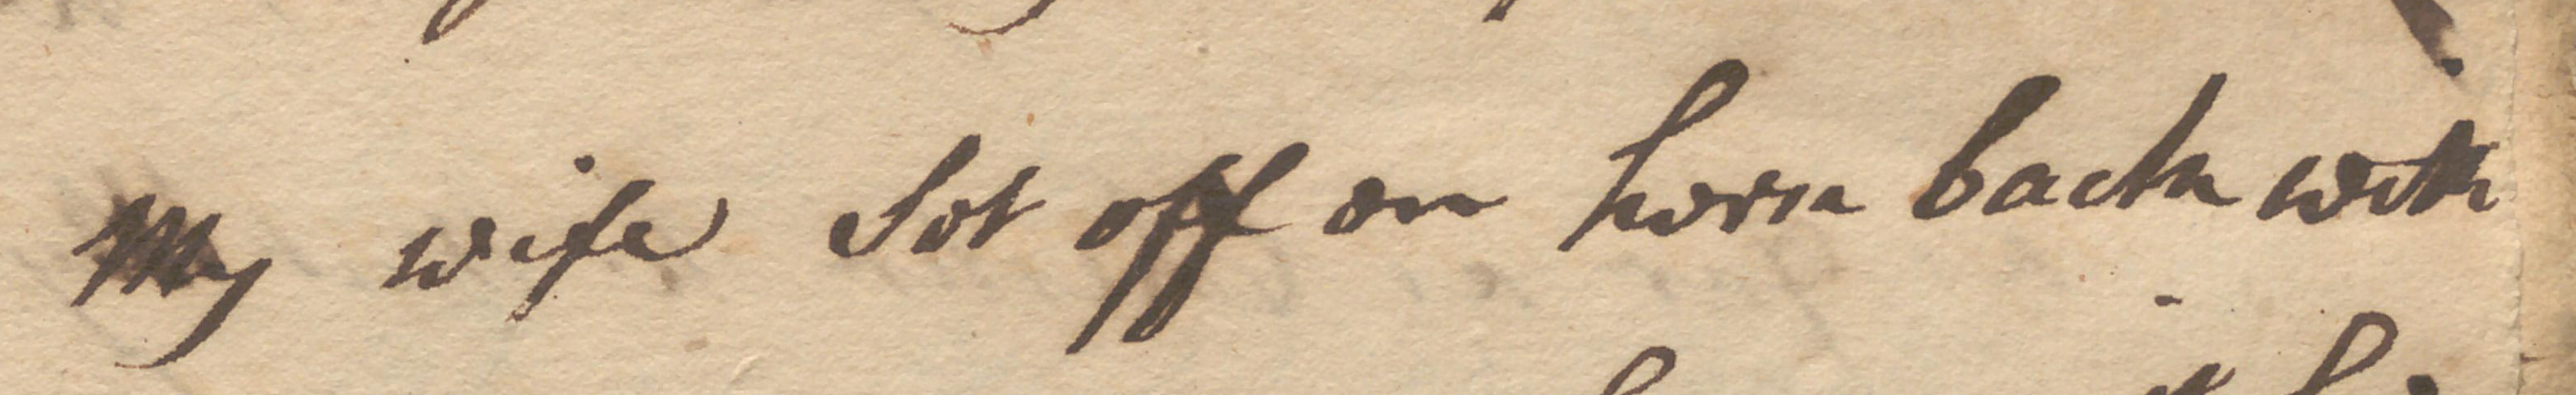My wife Set off on horse back wet
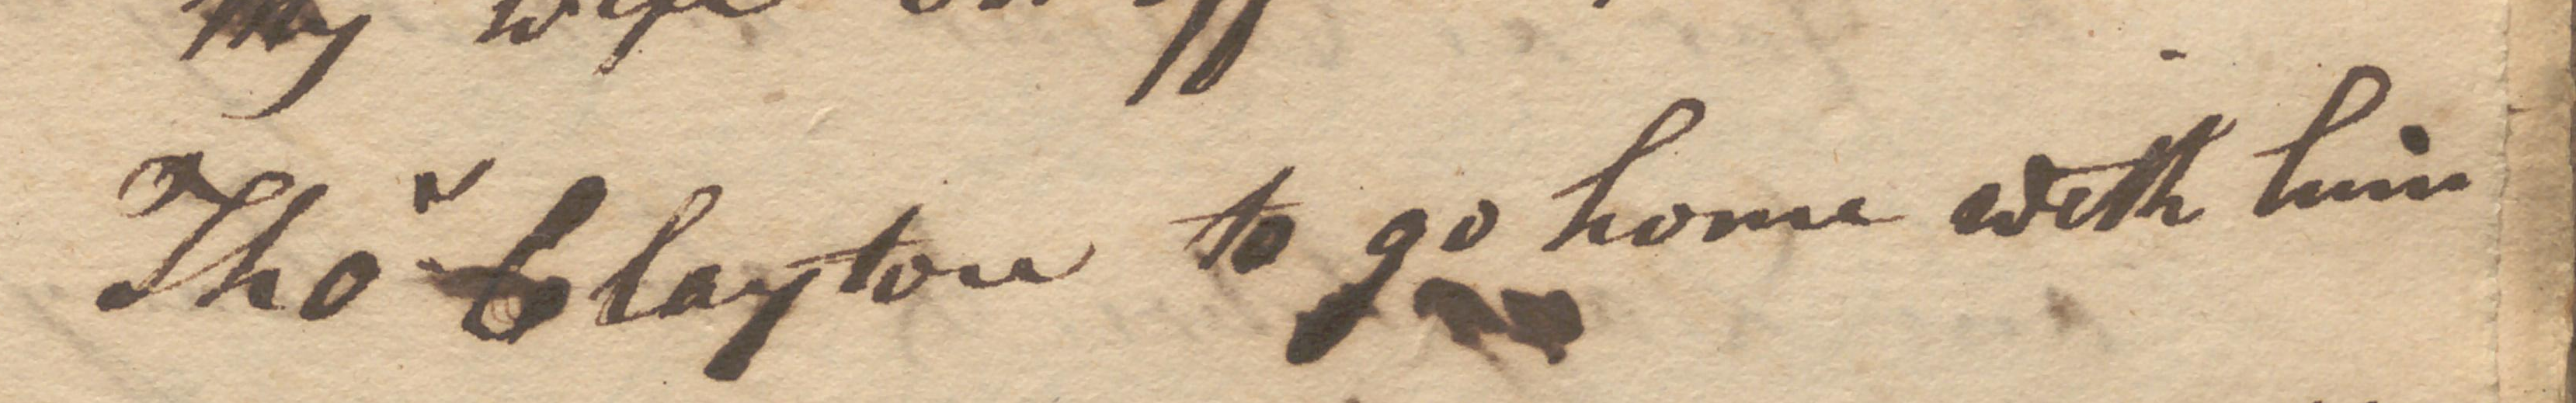Tho Clayton to go home with him
